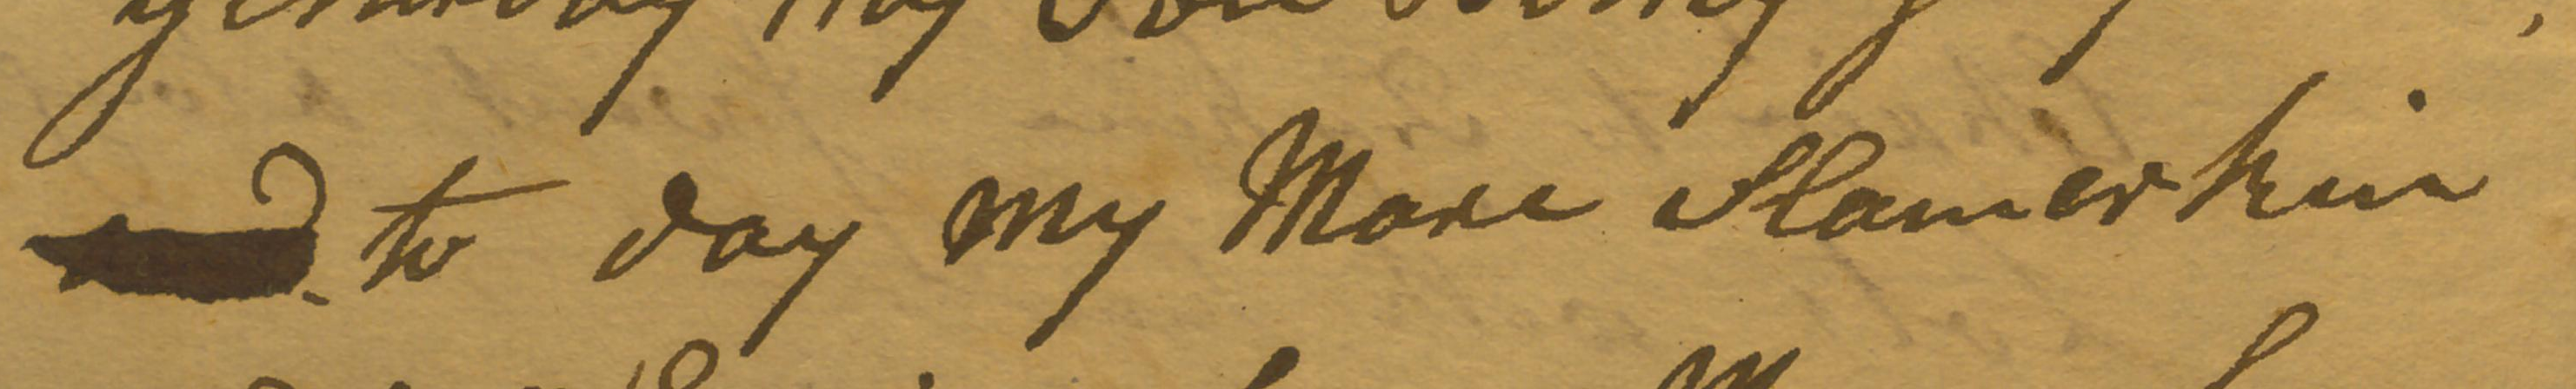[and] to day My Mare Slamerken
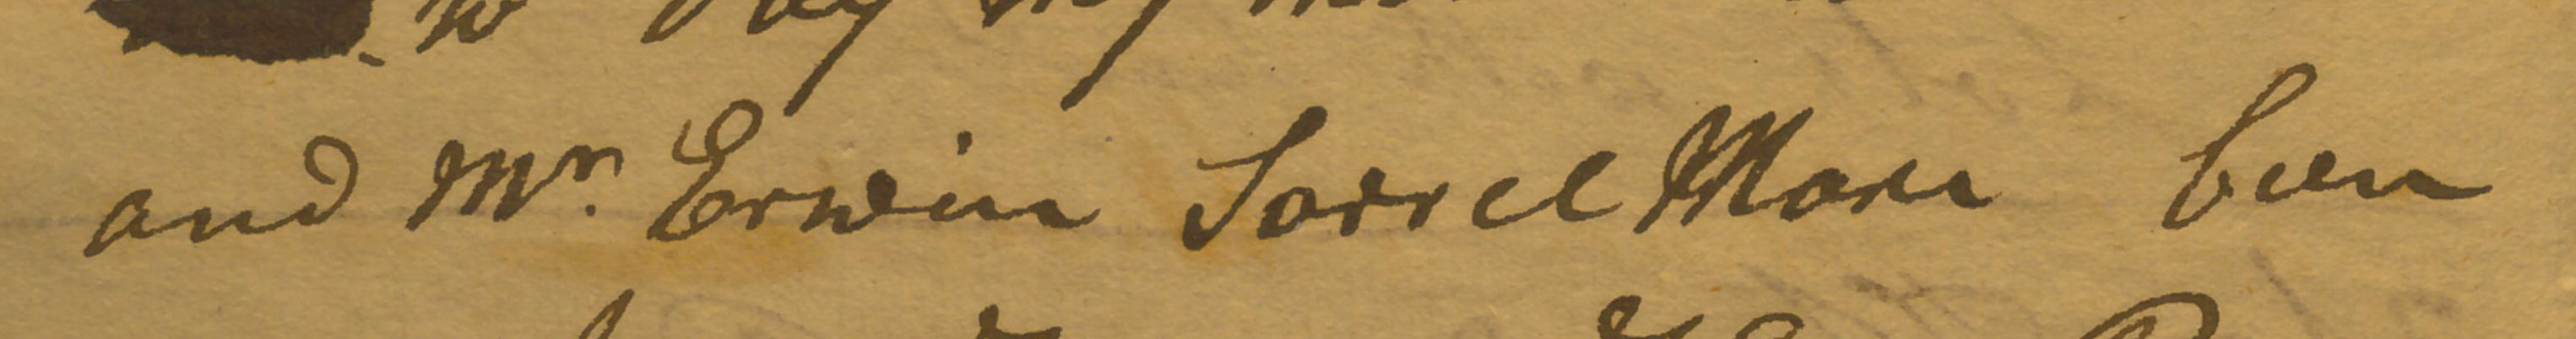and M^r. Erwin Sorrel Mare been
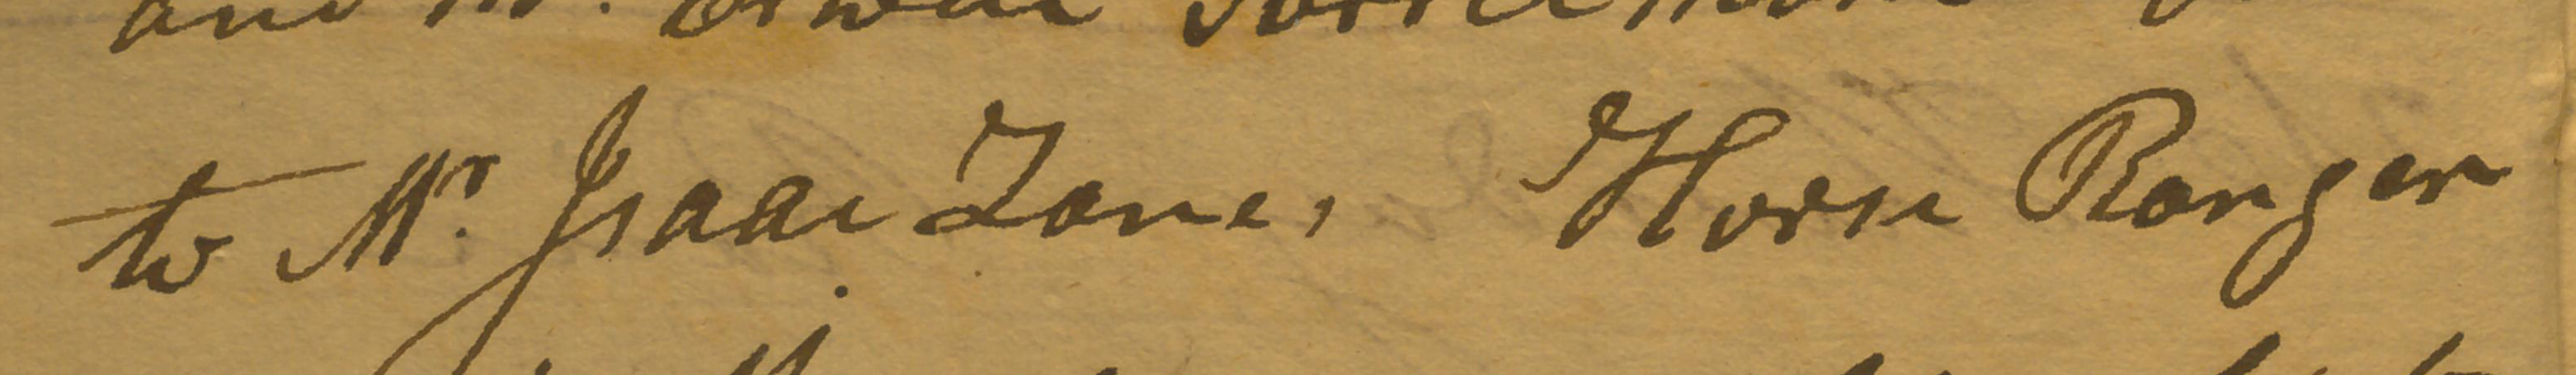to M^r. Isaac Zanes Horse Ranger
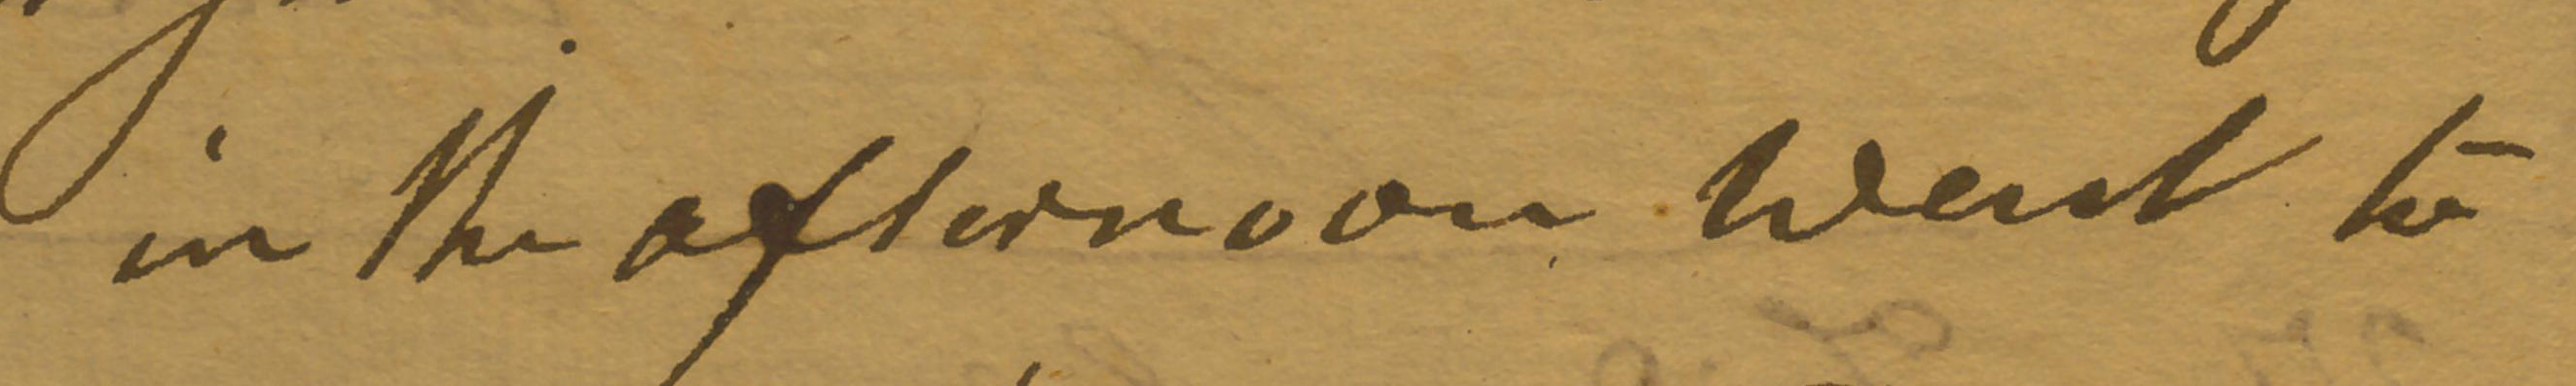in the afternoon went to
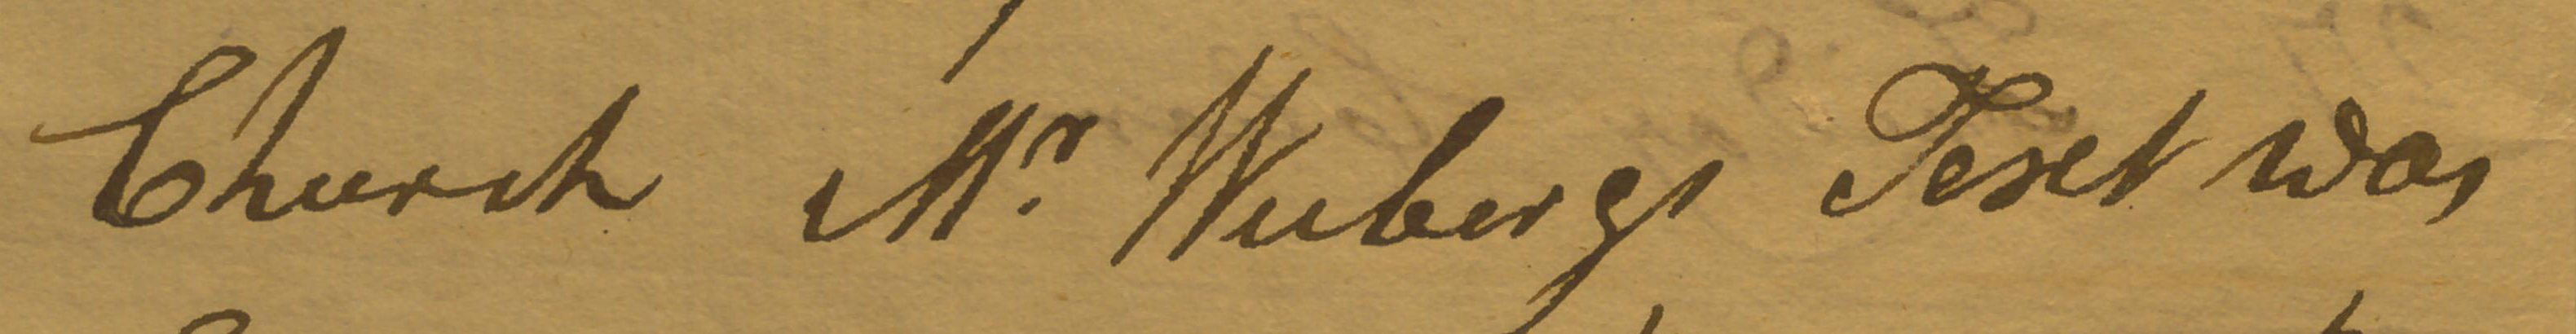Church M^r. Weibergs Text was
